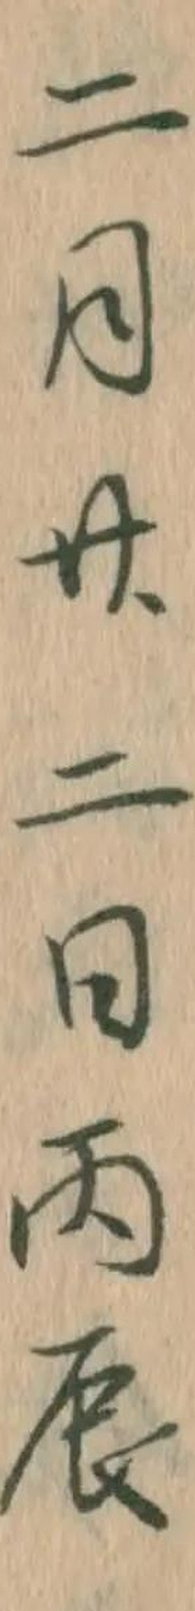二月廿二日丙辰
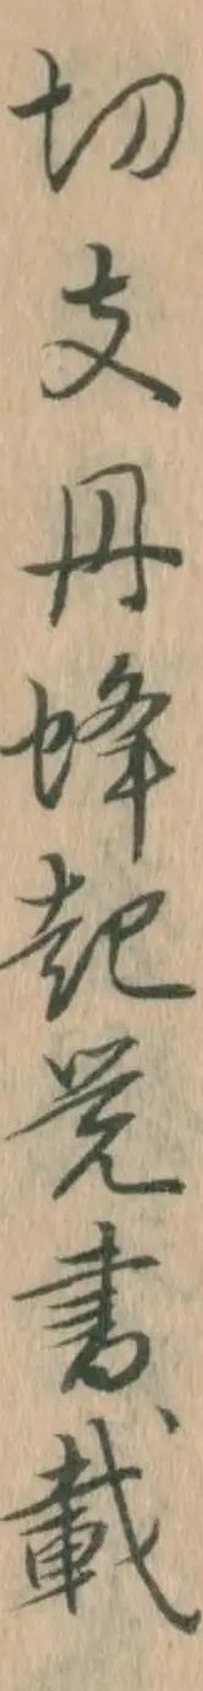切支丹蜂起覚書載
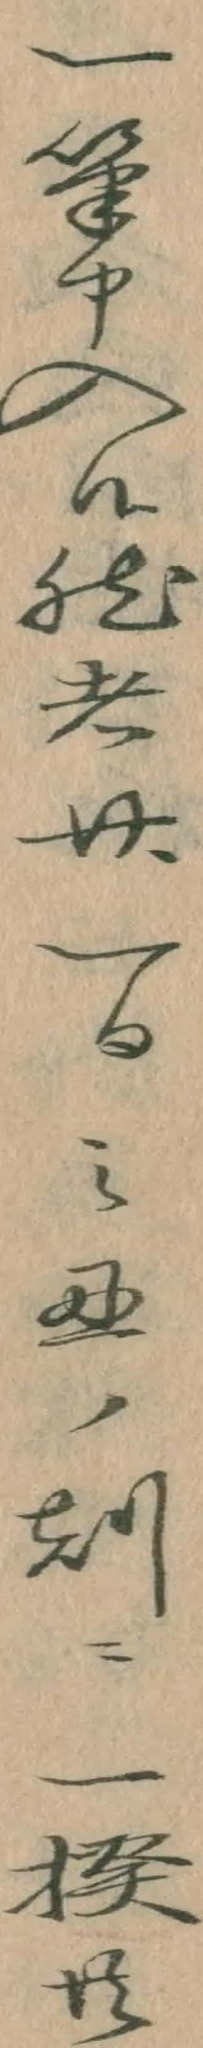一筆申入候然共廿一日之丑之刻に一揆共
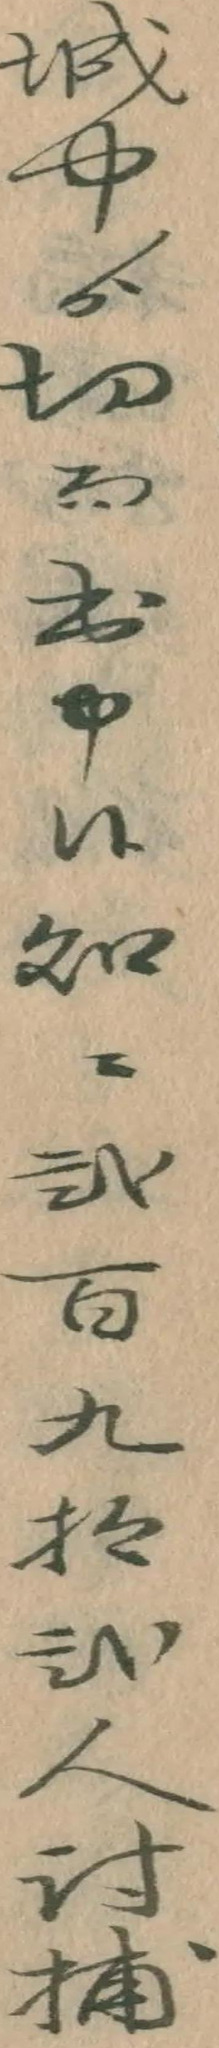城中ゟ切而出申候処に弐百九拾弐人討捕
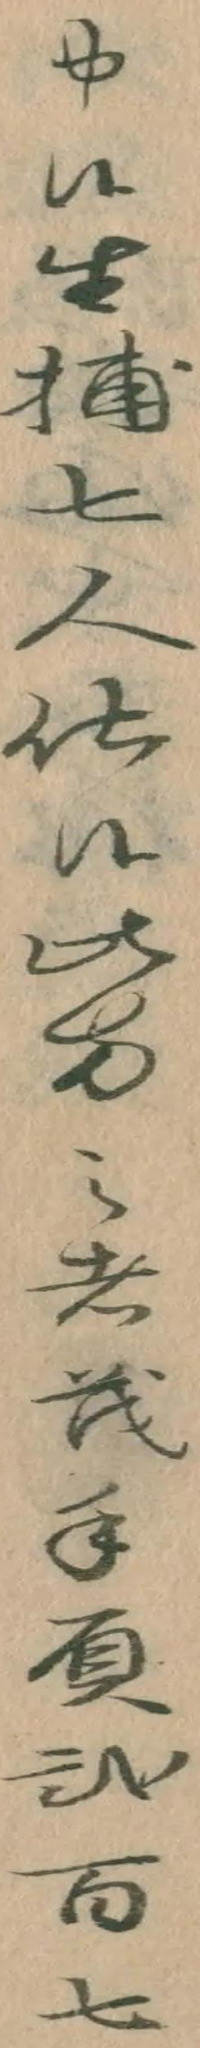申候生捕七人仕候此方之者茂手負弐百七
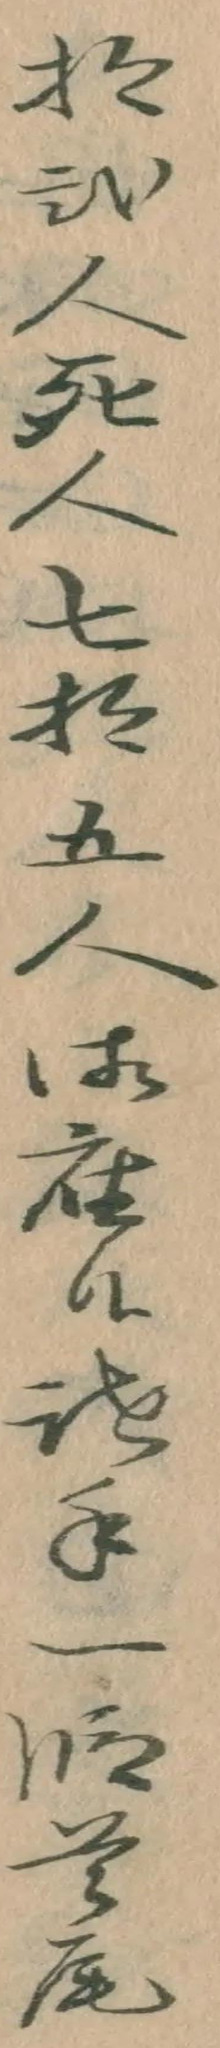拾弐人死人七拾五人御座候諸手一段首尾
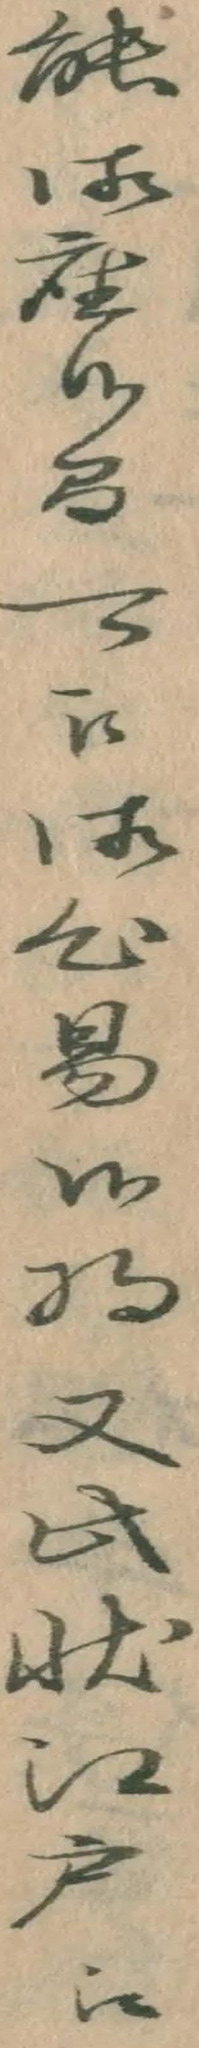能御座候間可被御心易候将又此状江戸江
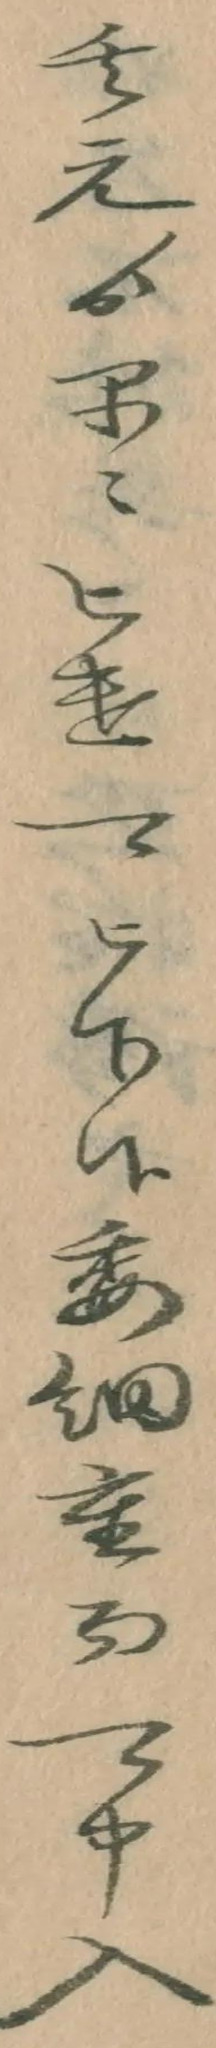其元ゟ早々被遣可被下候委細重而可申入

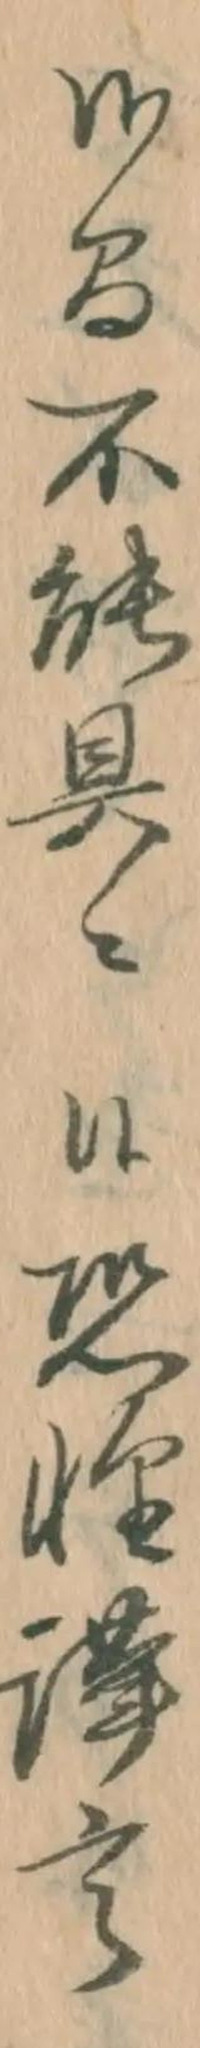候間不能具に候恐惶謹言
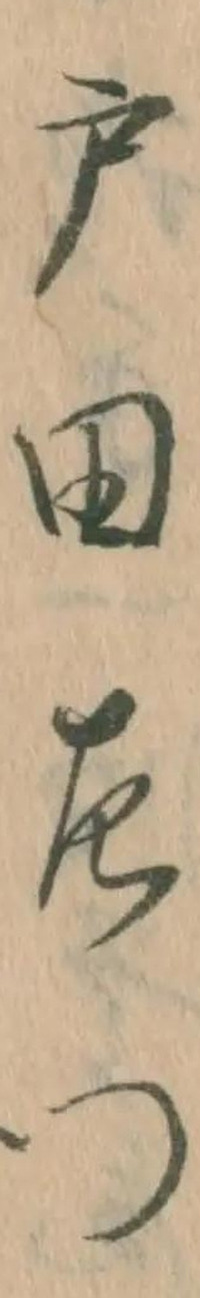戸田左門
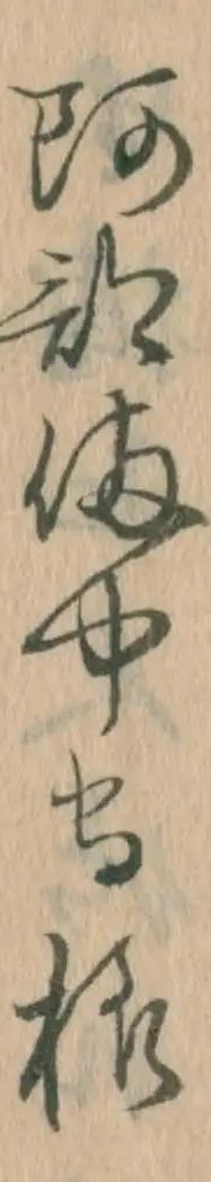阿部備中守様
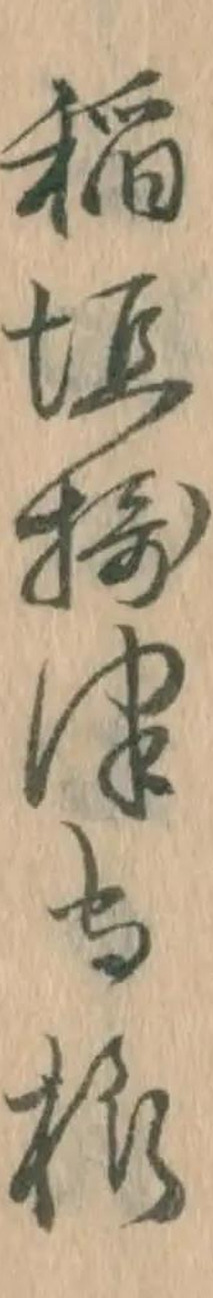稲垣摂津守様
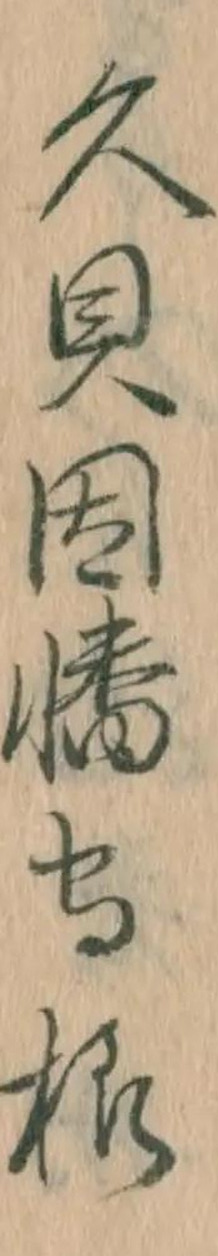久貝因幡守様
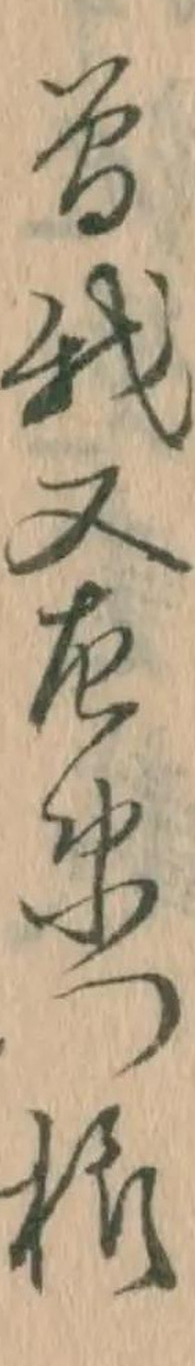曽我又左衛門様
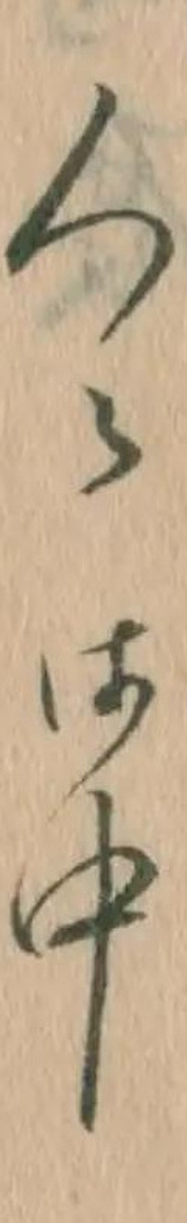人々御中
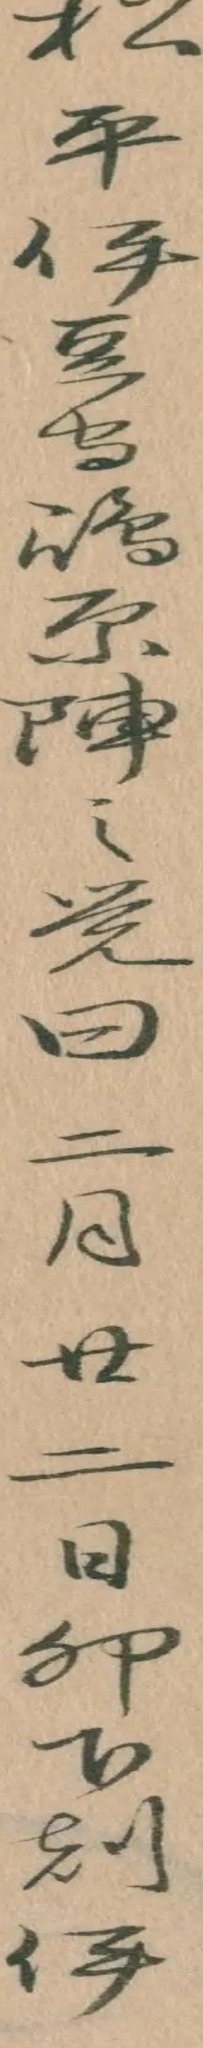松平伊豆守島原陣之覚曰二月廿二日夘下刻伊
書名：切支丹御退治記 49巻. [7]
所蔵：国立国会図書館 National Diet Library, JAPAN
